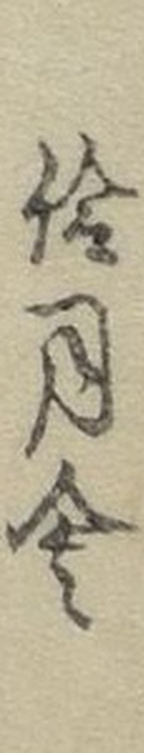伶月舎
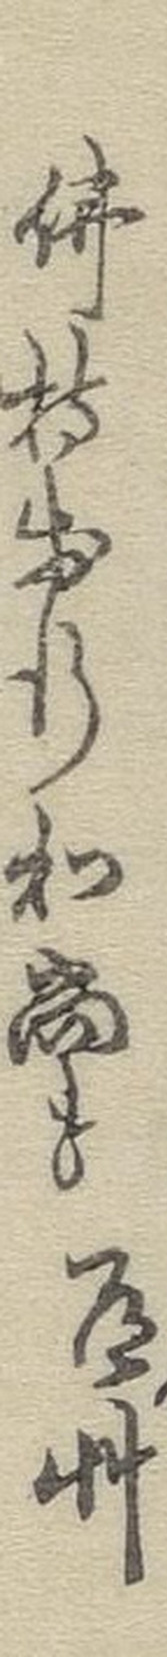仏持歩行和尚も道草
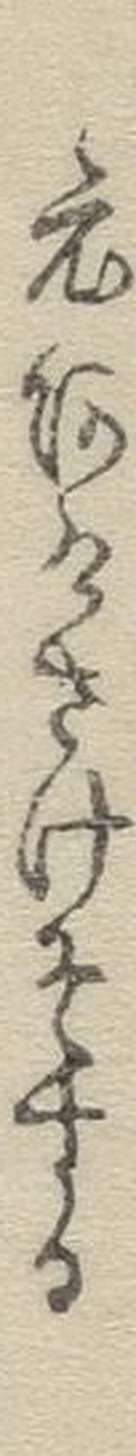衣あけさけそする
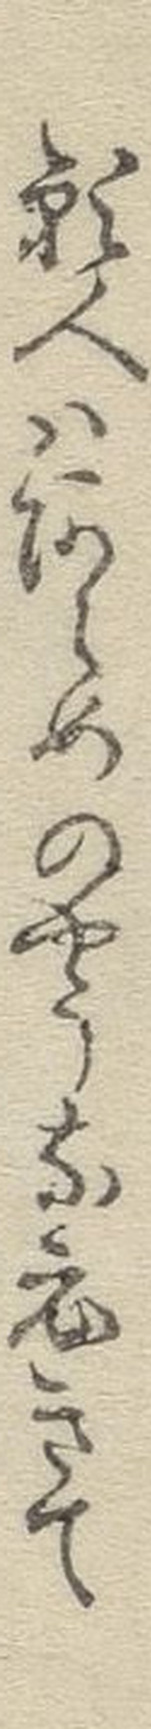願人はあらめのやうな衣きて
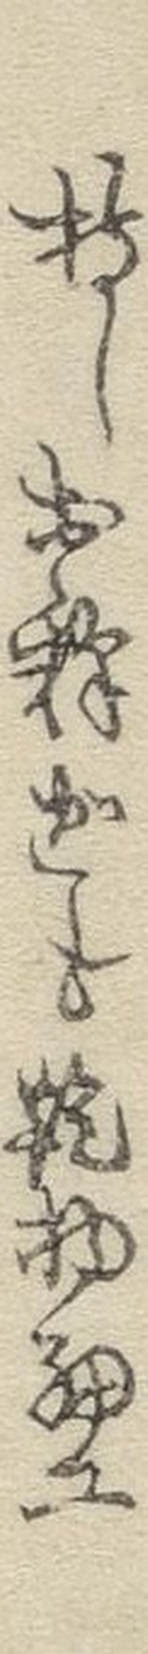持しお釈迦も鉋物細工
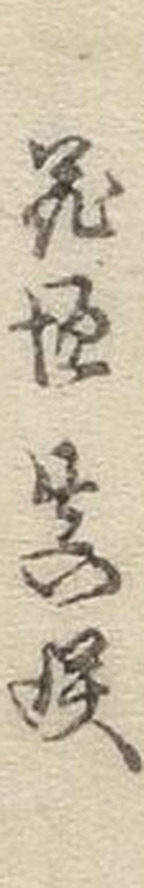花垣真咲
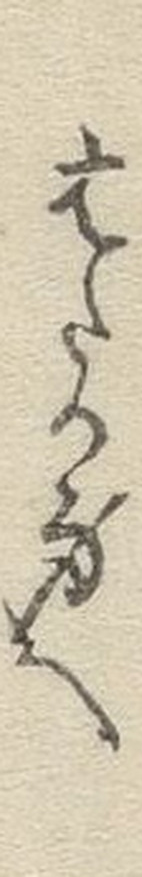はたか身へ
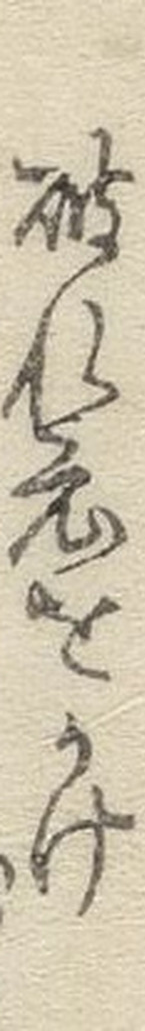破れ衣をかけ
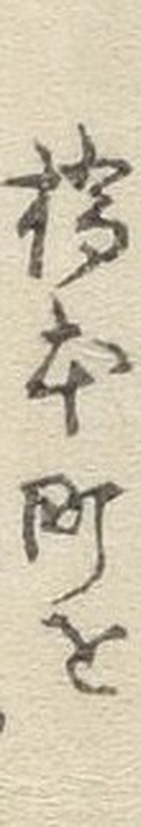橋本町を
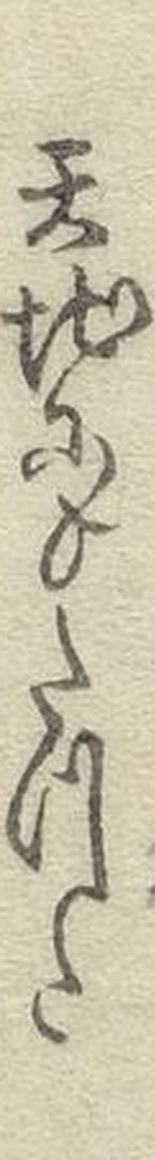天地にもたつた
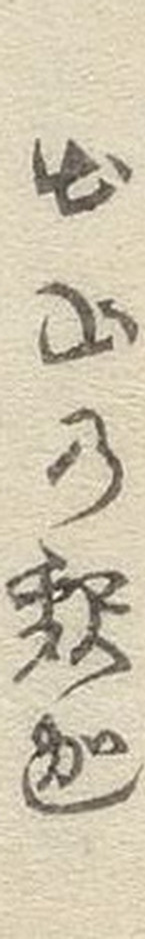出山の釈迦
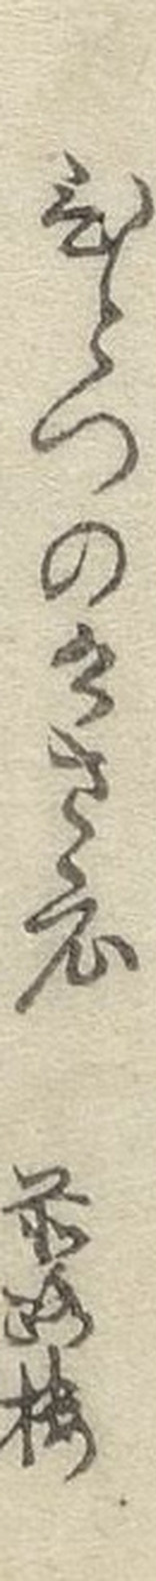ひとつのけさ衣前路楼
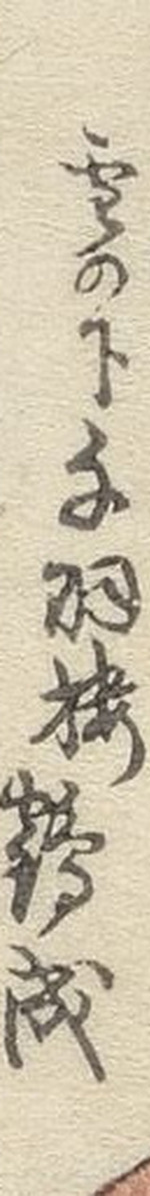雪の下千羽楼鶴成
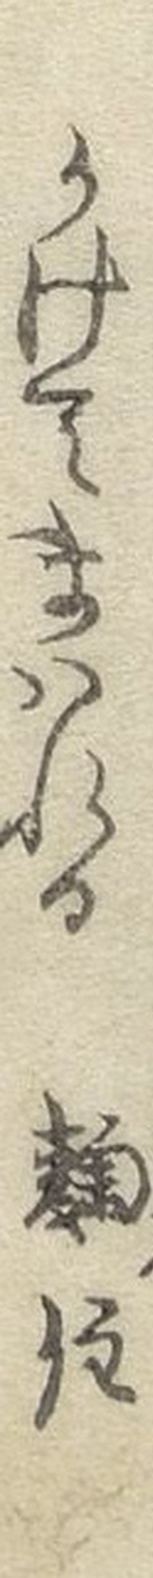かけてまはれる麹住
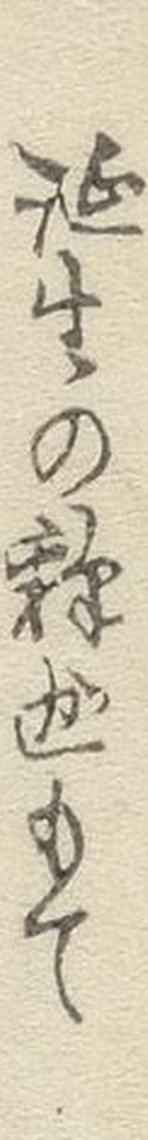誕生の釈迦もて
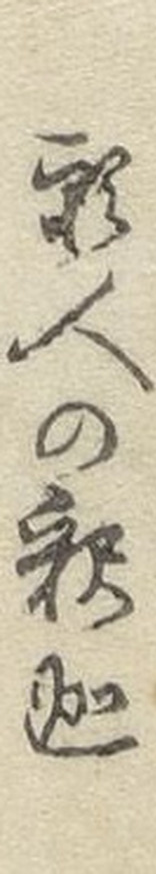願人の釈迦
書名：Picture Album of People with Kyōka (Light Verse) (Kyōka shiki jinbutsu 狂歌四季人物)
